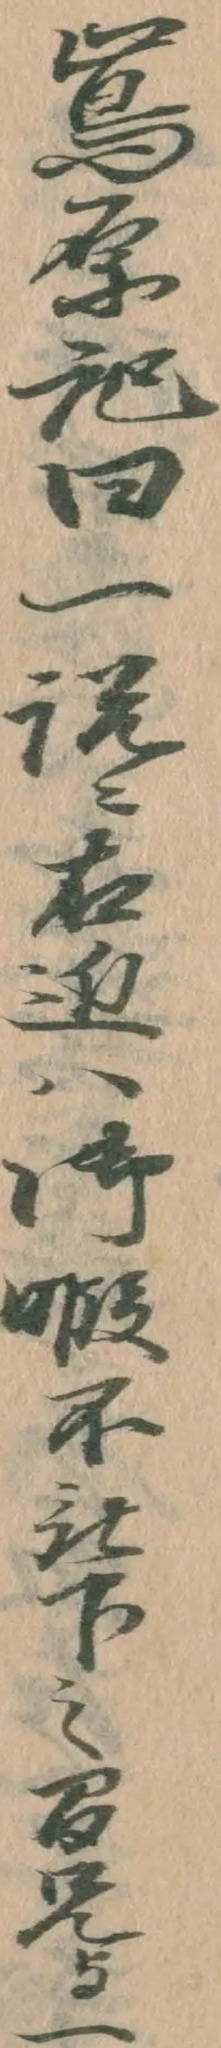島原記曰一説に右近は御暇不被下之間兄と一
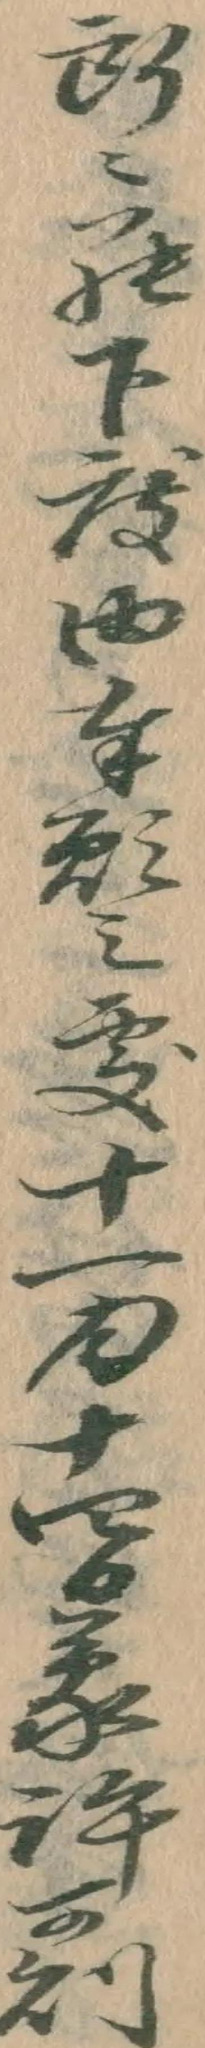所に罷下度由奉願之処十一月十四日蒙許可則
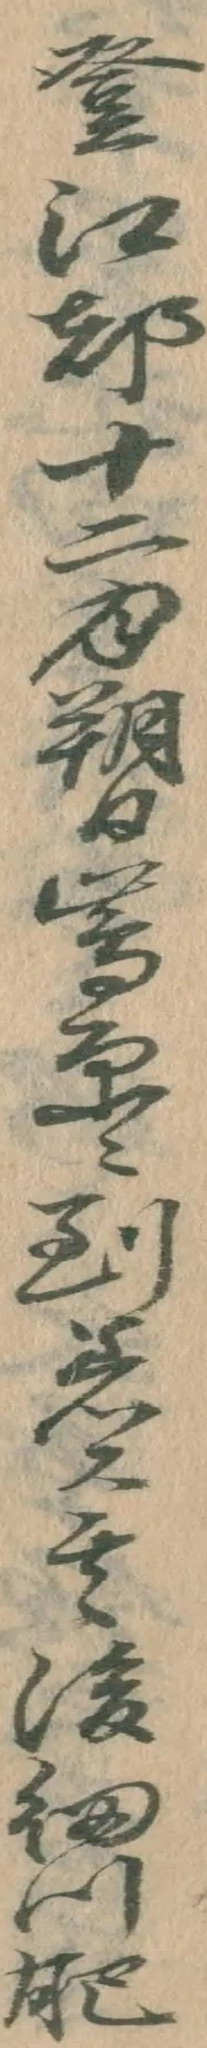登江都十二月朔日島原に到着ス其後細川肥
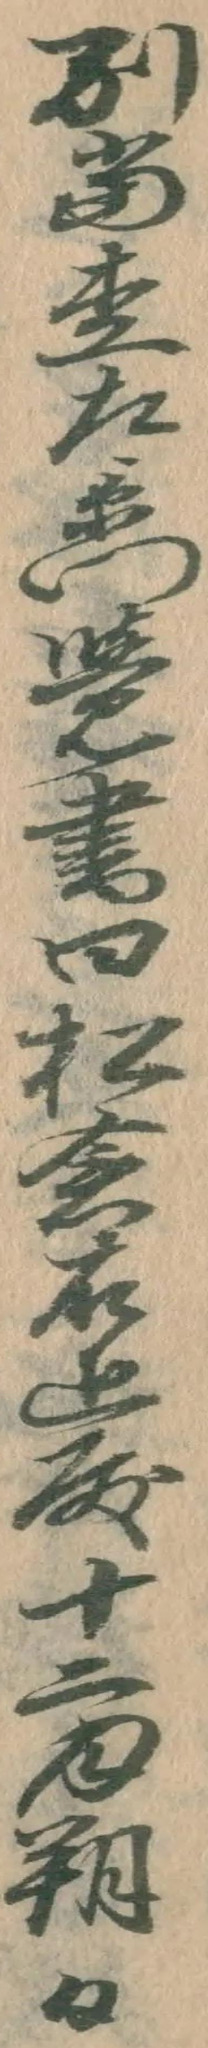別当杢左衛門覚書曰板倉右近殿十二月朔日
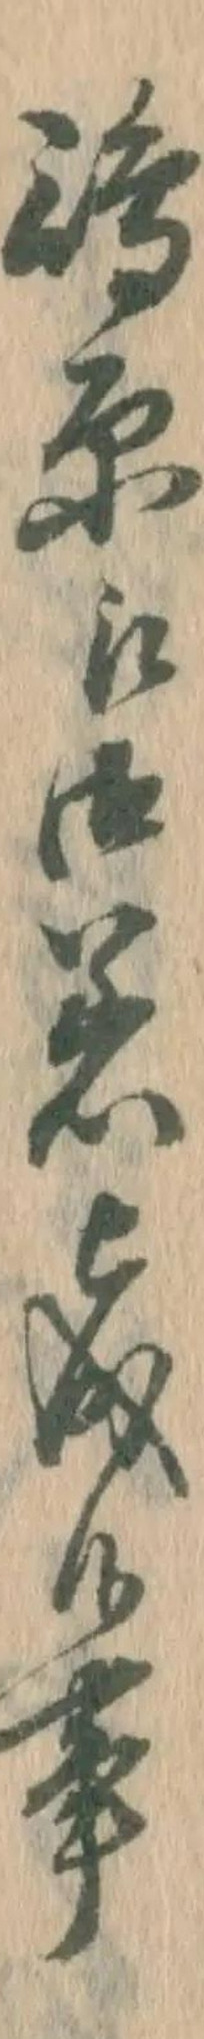島原江御着被成候事
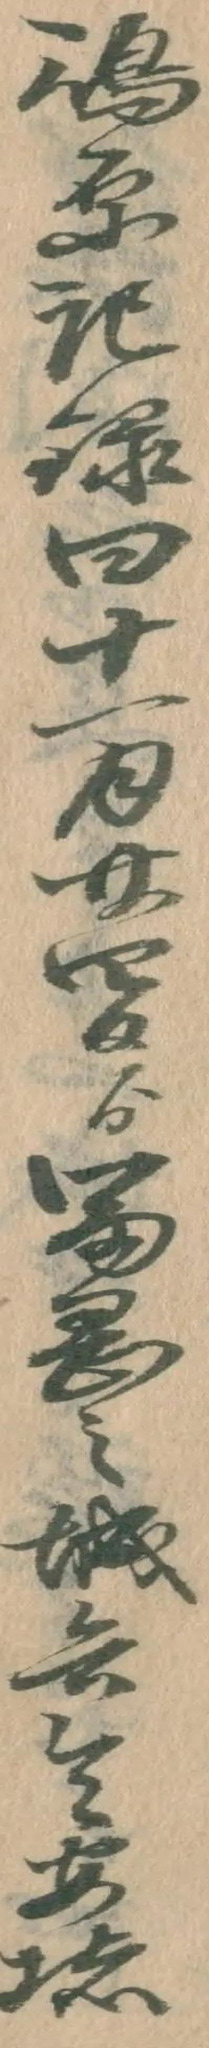島原記録曰十一月廿四日ゟ富岡之城兵令安堵
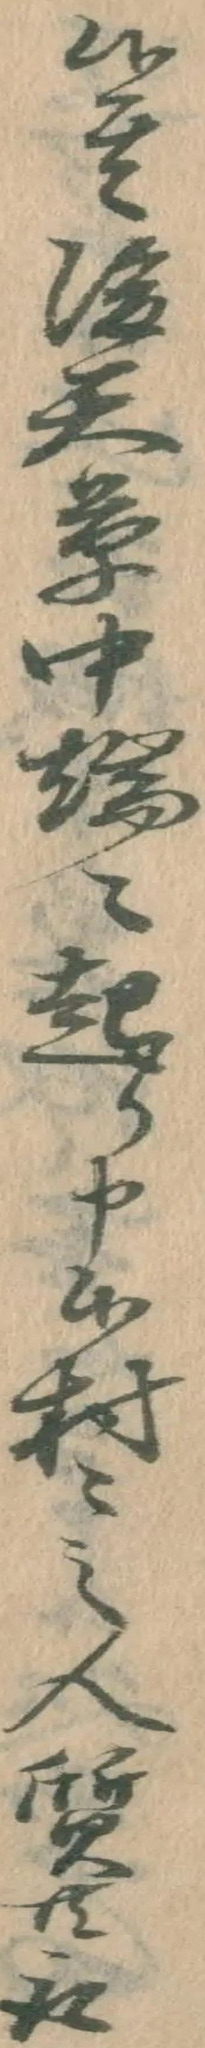候其後天草中端々起り申候村々之人質共取
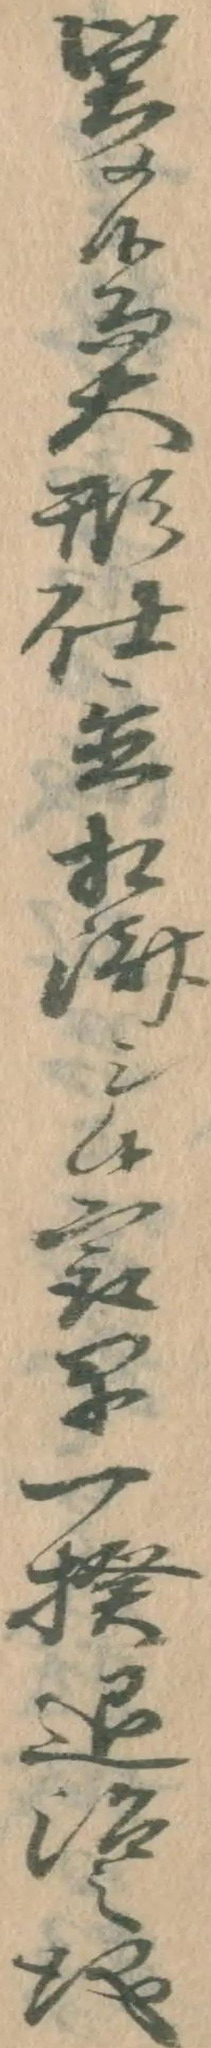堅メ候而大形仕置相済シ候最早一揆退治之儀

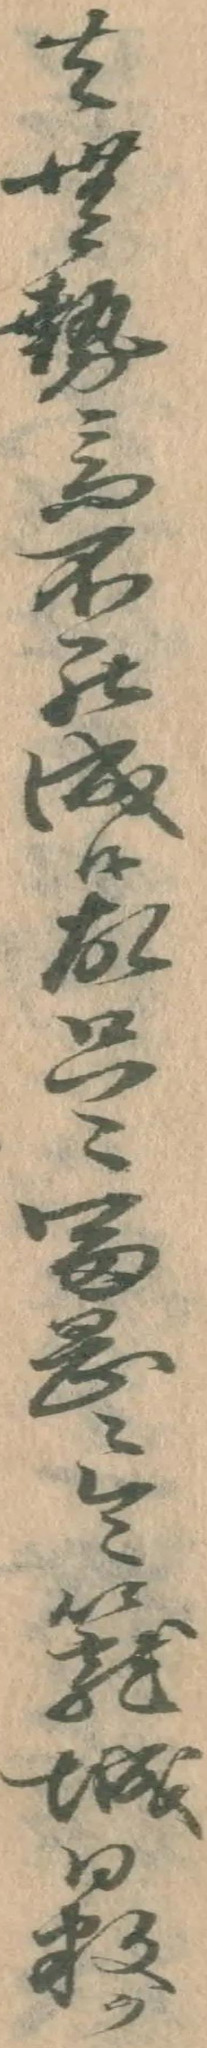は無勢に而不罷成候故只々富岡に令籠城日数ヲ
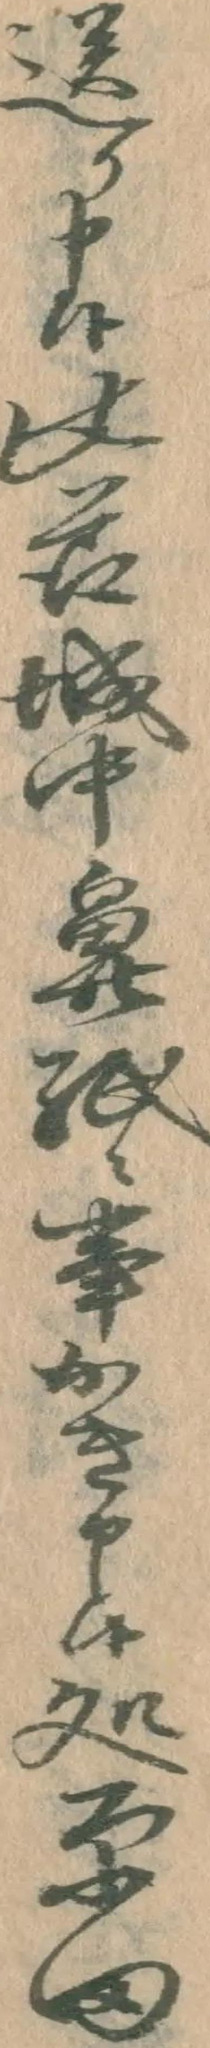送り申候此節城中鼻紙に事かき申候処原田
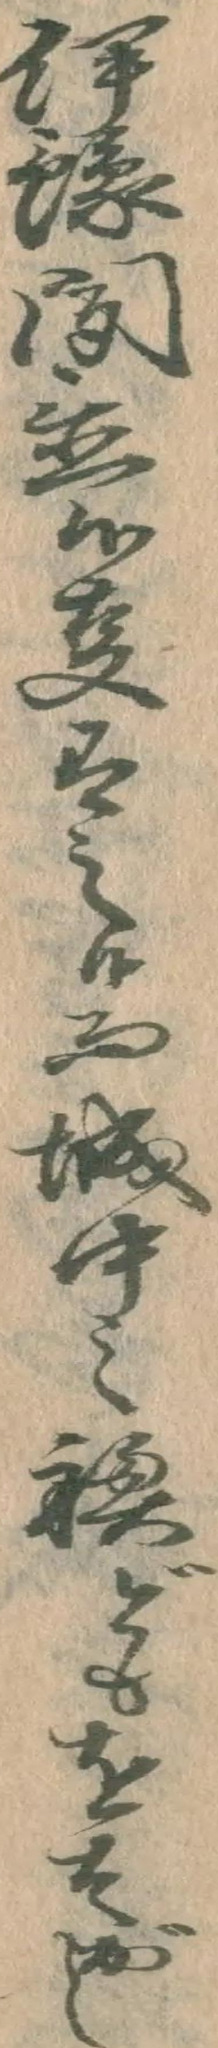伊予聞置候事有之候而城中之襖どもをはがし
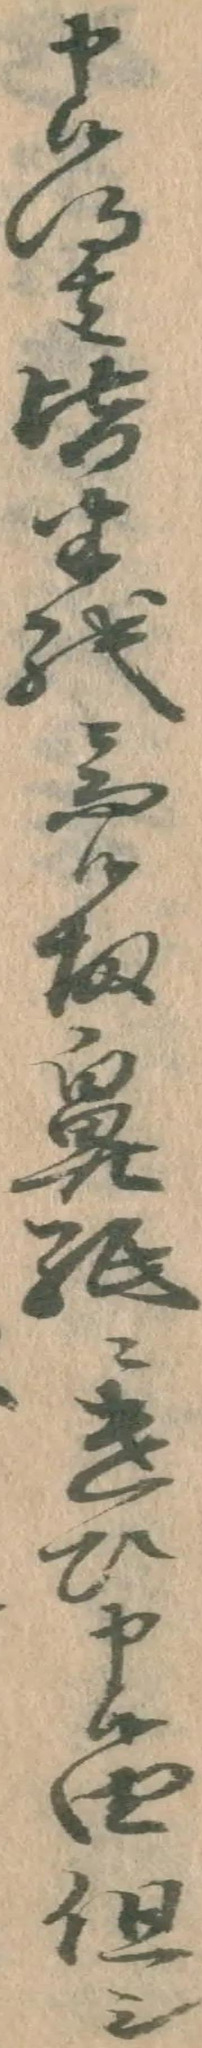申候得は皆半紙に而候切鼻紙に遣ひ申候由但シ
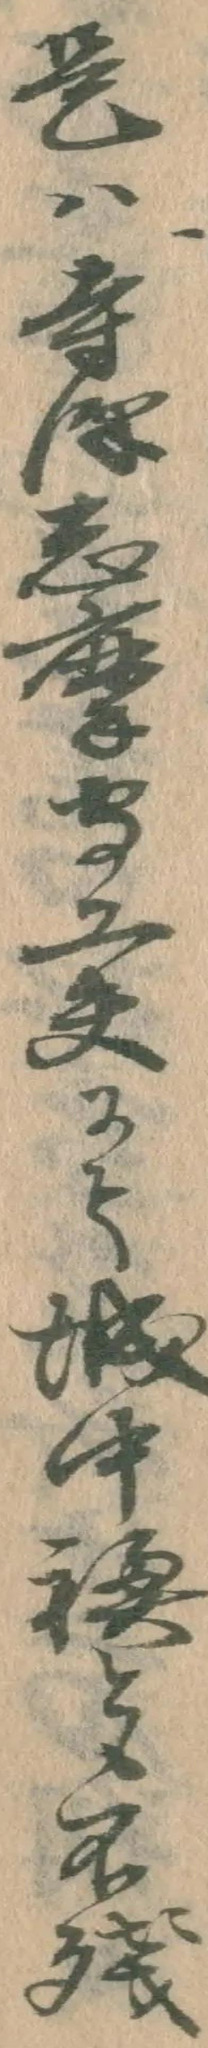是は寺沢志摩守工夫にて城中襖とも不残
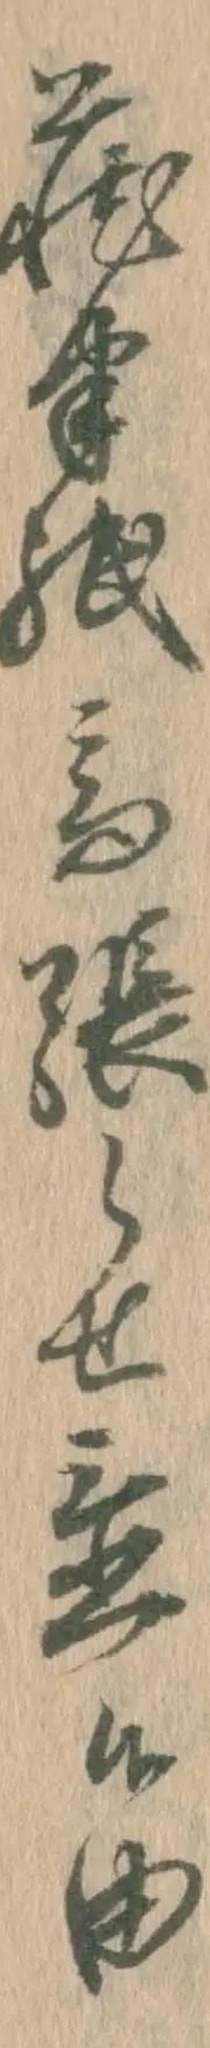蔵半紙に而張らせ置候由
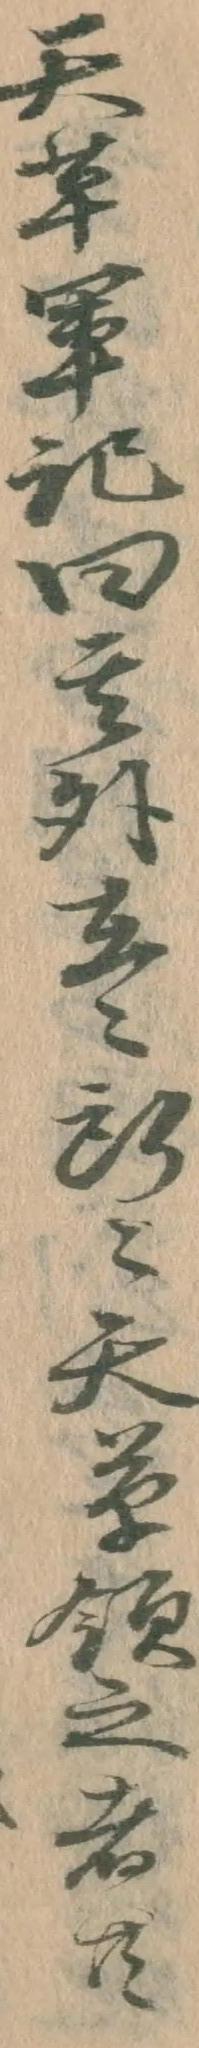天草軍記曰其外在々所々天草領之者共
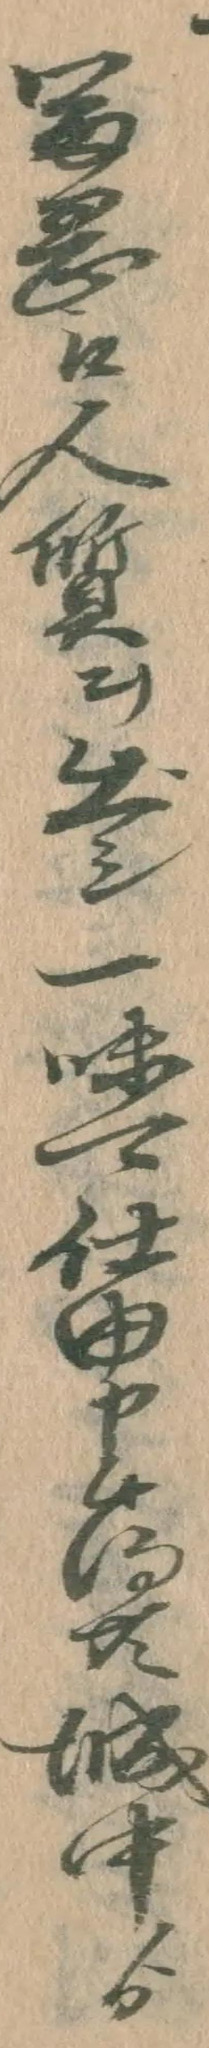富岡江人質ヲ出シ一味可仕由申候得共城中ゟ
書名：切支丹御退治記 49巻. [3]
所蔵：国立国会図書館 National Diet Library, JAPAN
